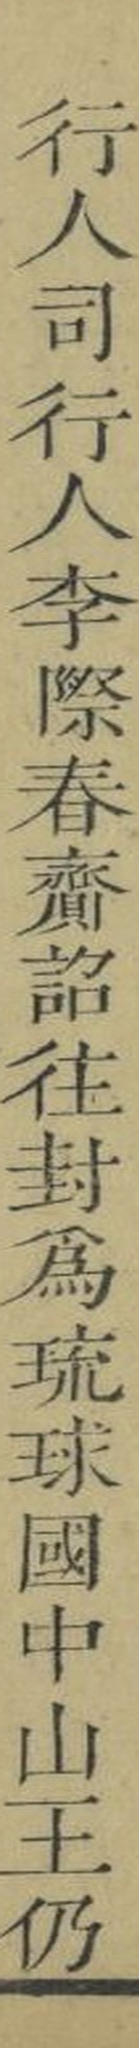行人司行人李際春齎詔往封為琉球国中山王仍
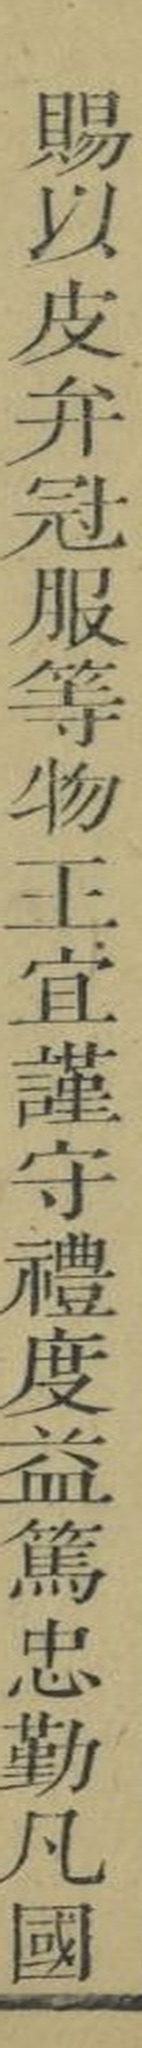賜以皮弁冠服等物王宜謹守礼度益篤忠勤凡国
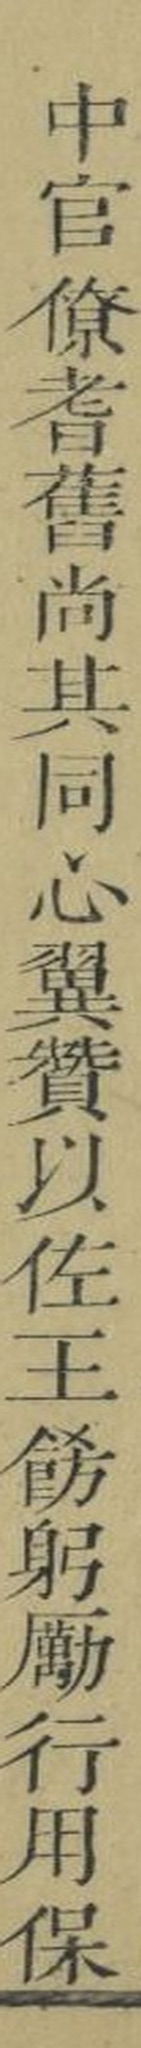中官僚耆旧尚其同心翼賛以佐王餝躬励行用保
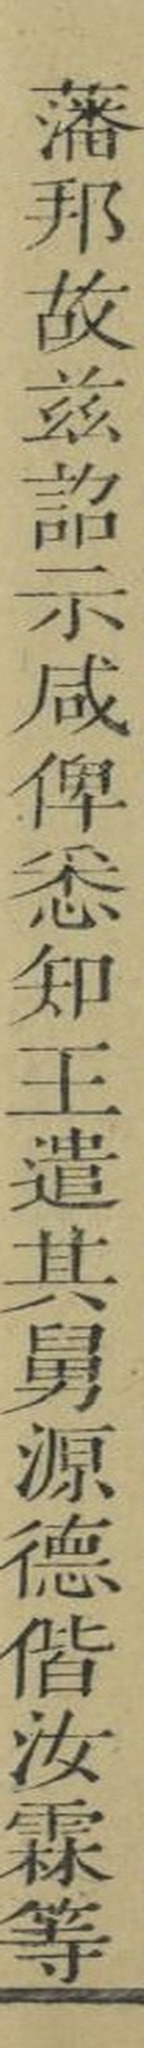藩邦故茲詔示咸俾悉知王遣其舅源徳偕汝霖等
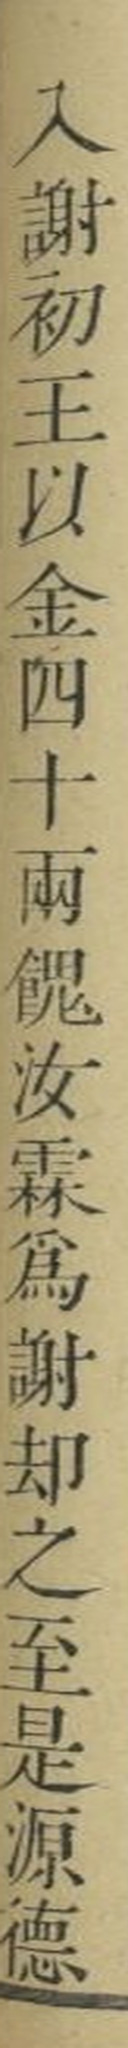入謝初王以金四十両餽汝霖為謝却之至是源徳
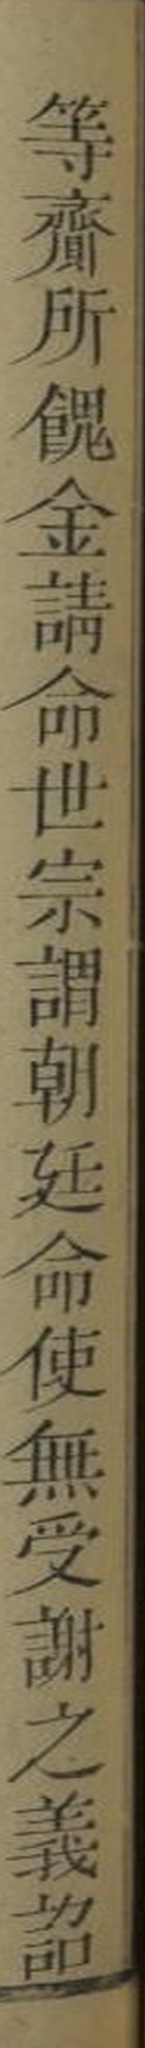等齎所餽金請命世宗謂朝廷命使無受謝之義詔
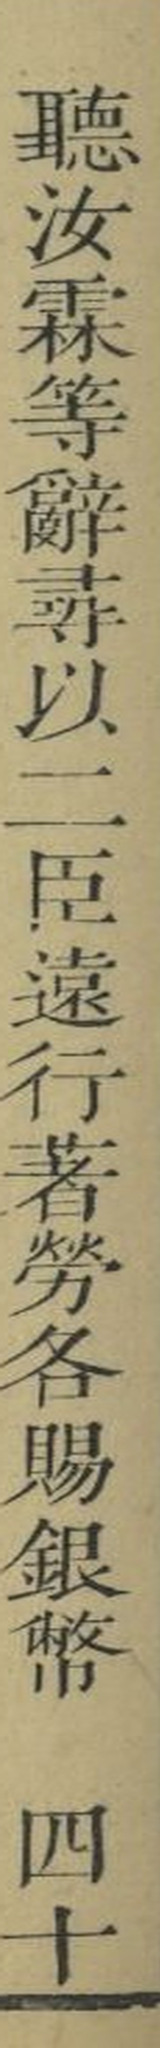聴汝霖等辞尋以二臣遠行著労各賜銀幣四十
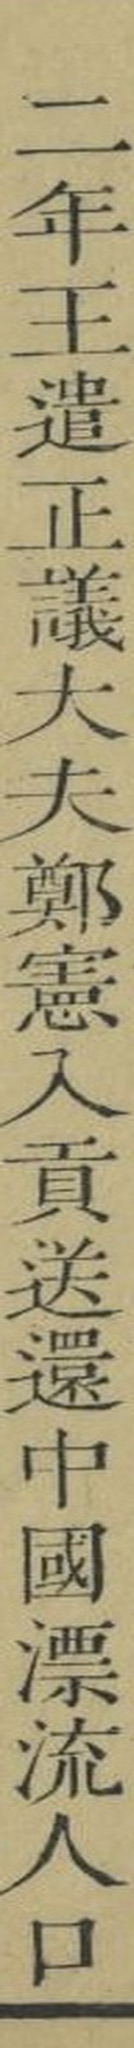二年王遣正議大夫鄭憲入貢送還中国漂流人口
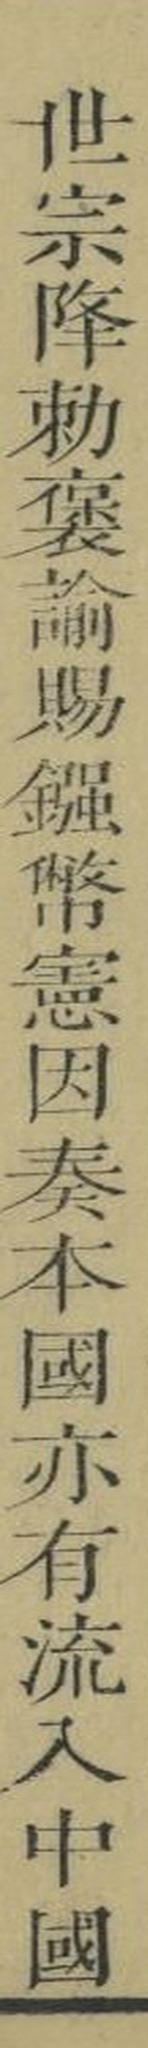世宗降勅褒諭賜鏹幣憲因奏本国亦有流入中国
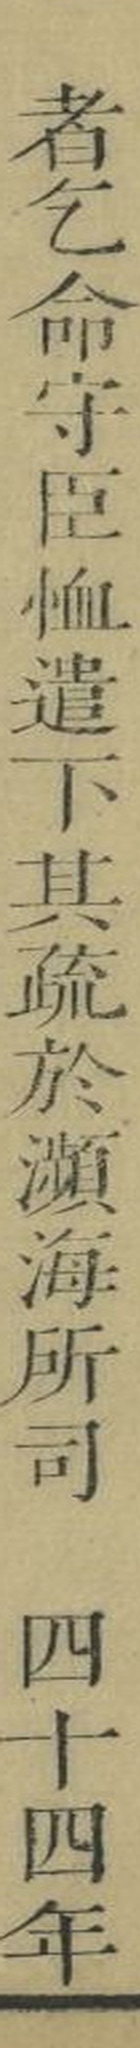者乞命守臣恤遣下其疏於瀕海所司四十四年
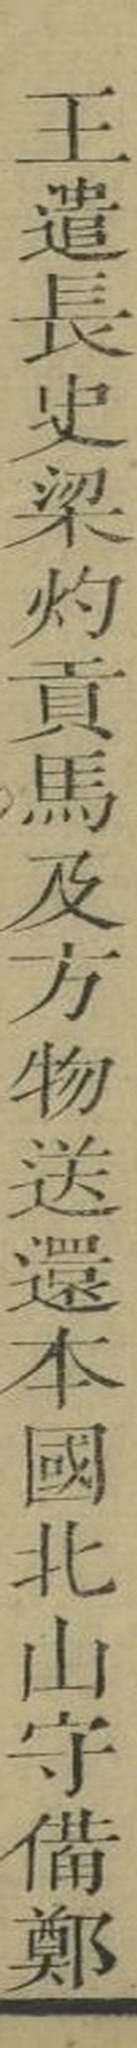王遣長史梁灼貢馬及方物送還本国北山守備鄭
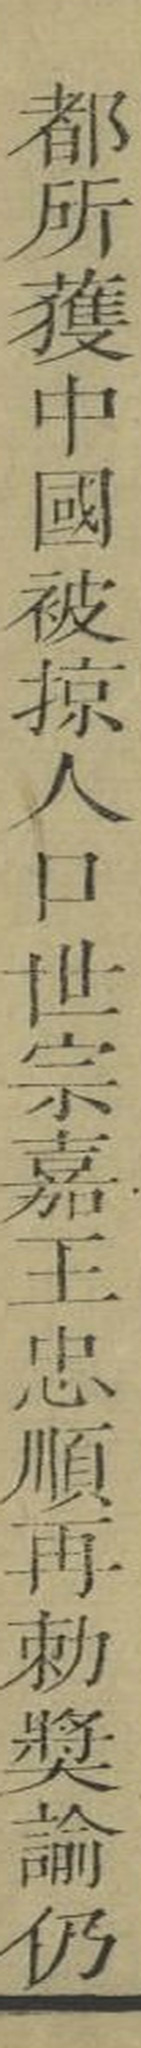都所獲中国被掠人口世宗嘉王忠順再勅奨諭仍
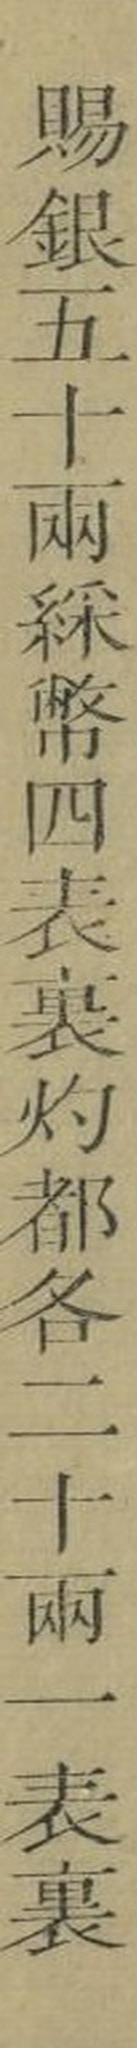賜銀五十両綵幣四表裏灼都各二十両一表裏
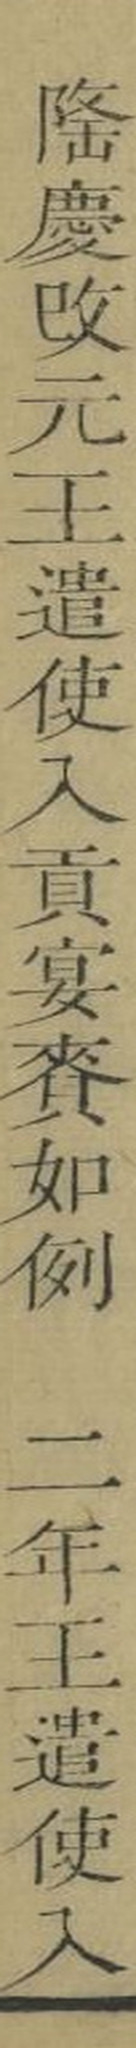慶改元王遣使入貢宴賚如例二年王遣使入

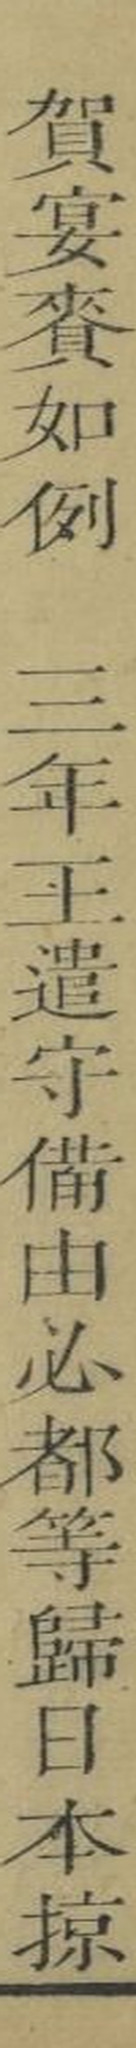賀宴賚如例三年王遣守備由必都等帰日本掠
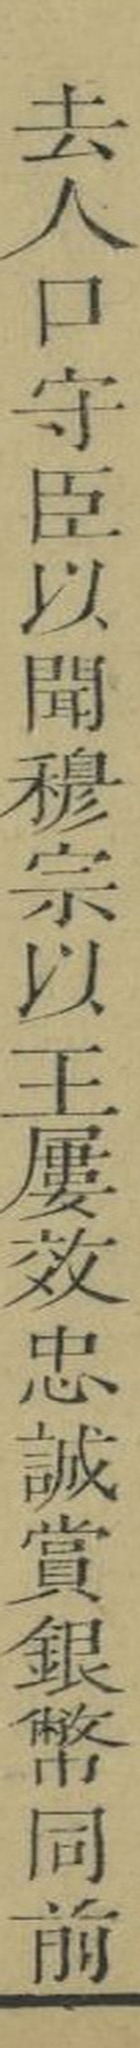去人口守臣以聞穆宗以王屢效忠誠賞銀幣同前
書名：中山伝信録 巻三
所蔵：University of the Ryukyus Library
